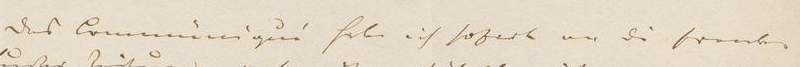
Das Communiqué habe ich sofort an die Frank-
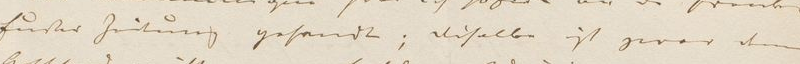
furter Zeitung gesandt; dieselbe ist zwar dem
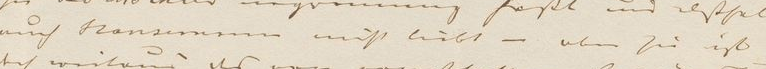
auch Hansemann nicht liebt – aber sie ist
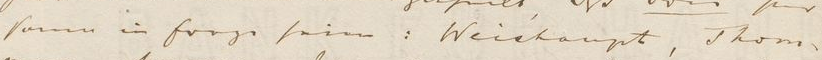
sonen in Frage seien: Weishaupt, Thom-
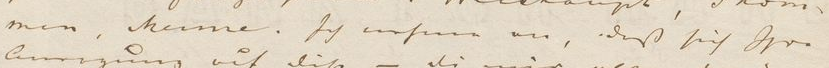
men, Menne. Ich nehme an, daß sich Ihre
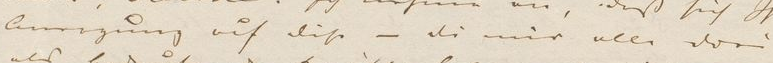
Anregung auf diese – die mir alle drei
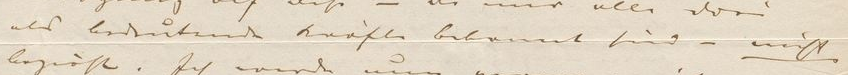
als bedeutende Kräfte bekannt sind – nicht
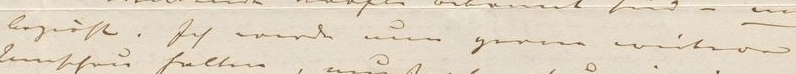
bezieht. Ich werde nun gerne weitere
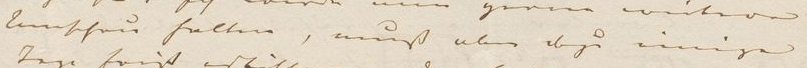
Umschau halten, muß aber dazu einige
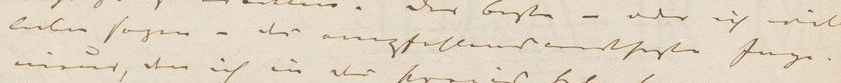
lieber sagen – der empfehlenswertheste Inge-
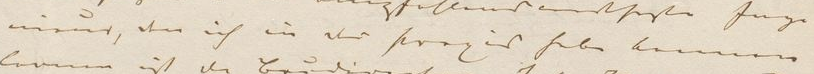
nieur, den ich in der Praxis habe kennen
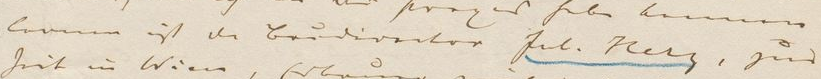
lernen ist der Baudirector Jul. Herz, zur
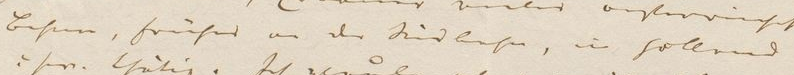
Bahnen, früher an der Südbahn, in Holland
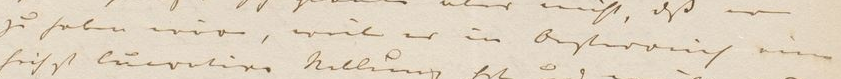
zu haben wäre, weil er in Oesterreich eine
